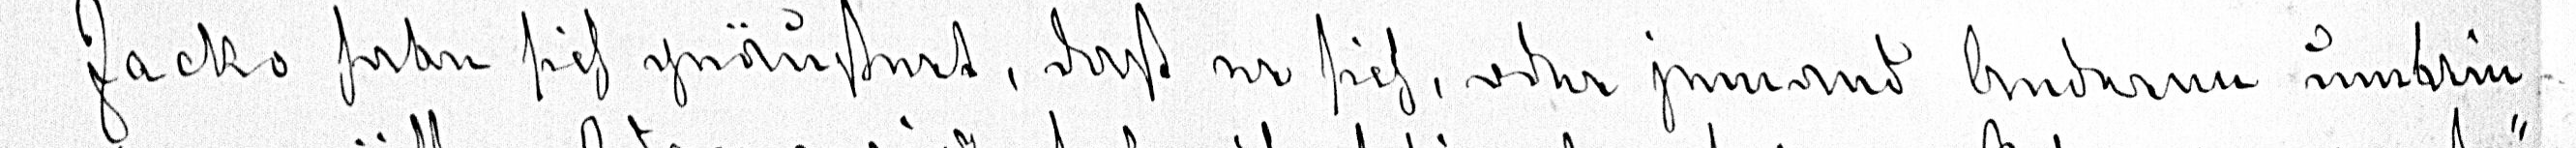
Jacko habe sich gnäußert, daß er sich, oder jemand Anderen umbrin¬
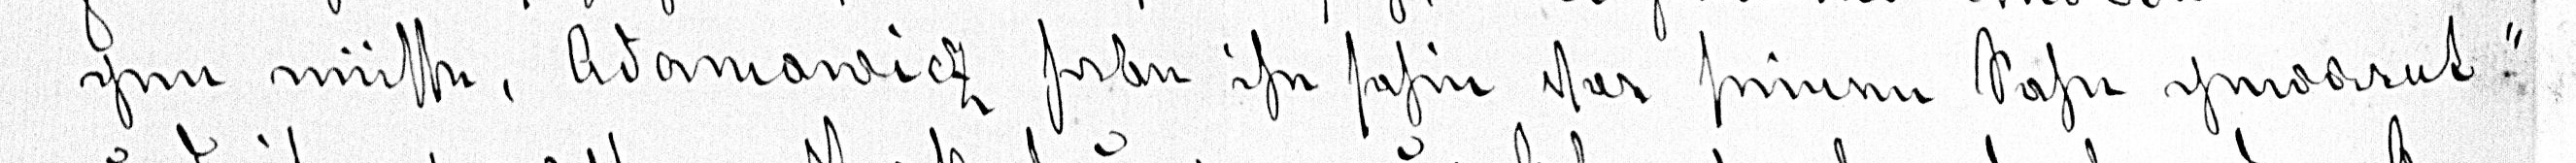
gen müsse, Adamowicz habe ihn sohin vor seinen Sohn gexxnt"
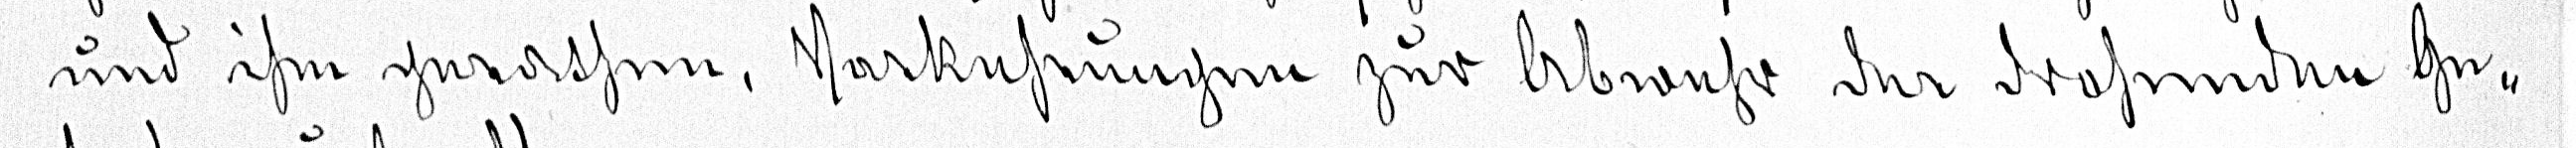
und ihm gerathen, Vorkehrungen zur Abwehr der Drohenden Ge¬
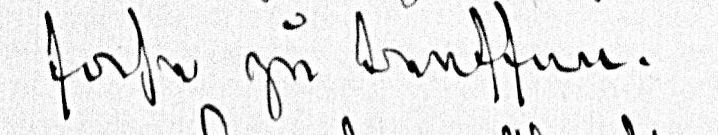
fahr zu treffen.
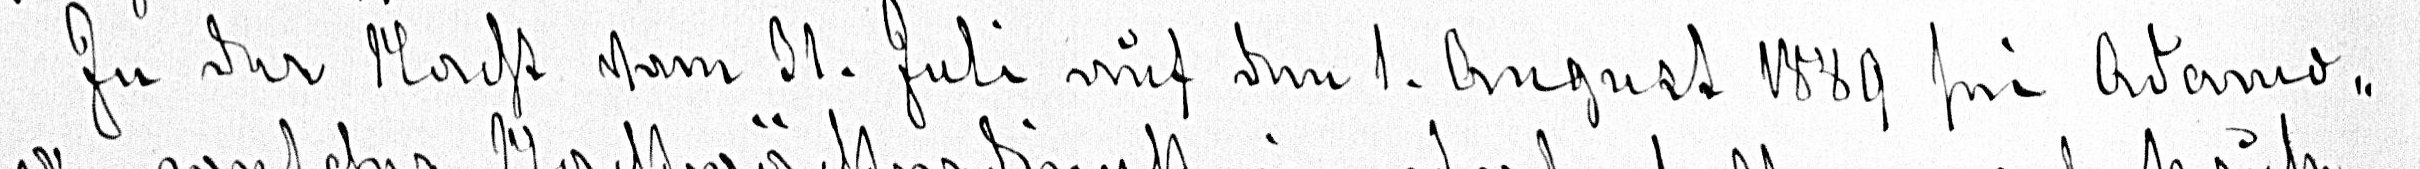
In der Nacht vom 31. Juli auf den 1. August 1889 sei Adamo¬
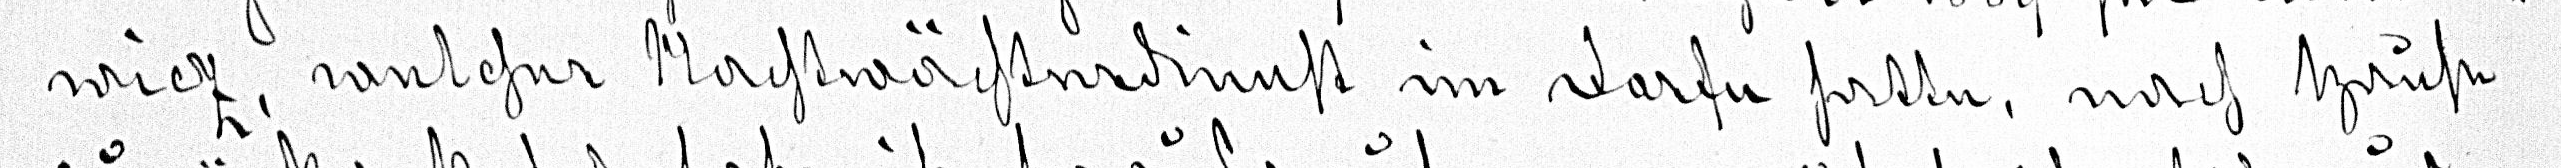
wicz, welcher Nachwächterdienst im Dorfe hatte, nach Hause
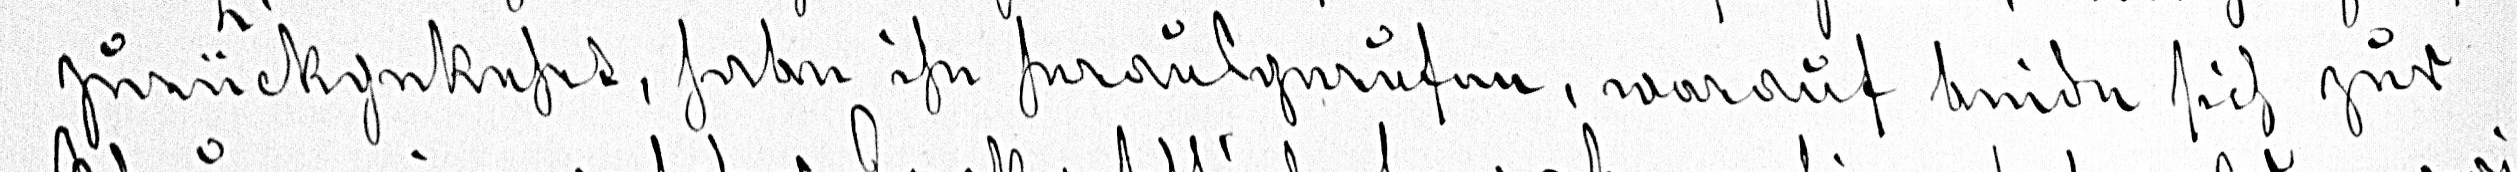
zurückgekehrt, habe ihn herausgerufen, worauf beide sich zur
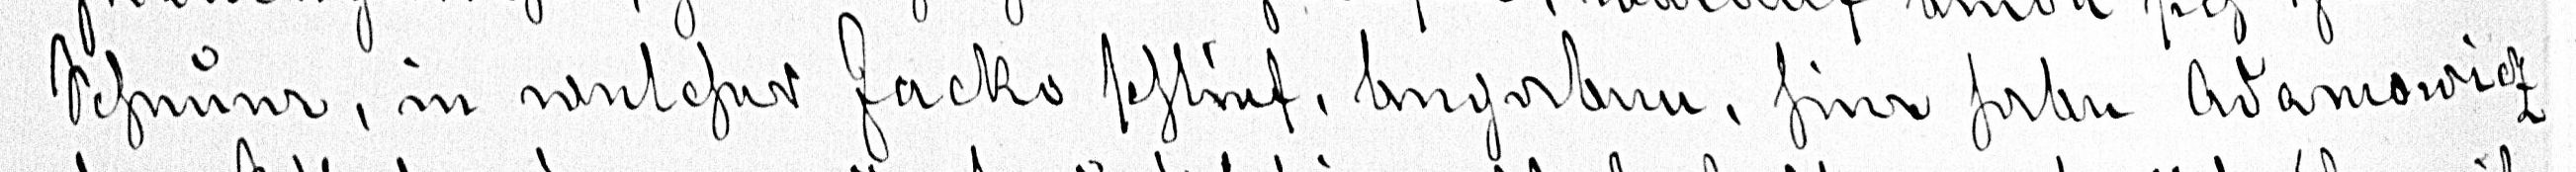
Schnuer, in welcher Jacko schlief, begaben, hier habe Adamowicz
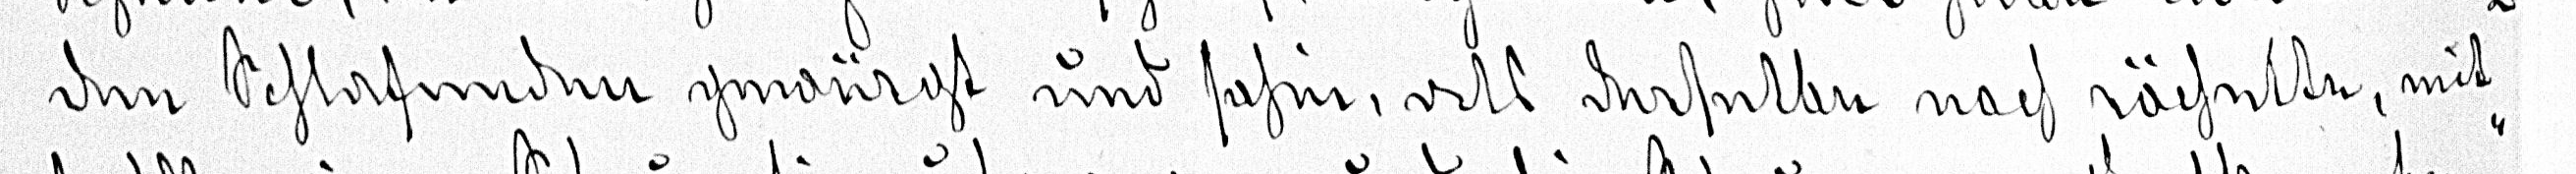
den Schlafenden gewürgt und sxxhin, als derselbe nach röchelte, mit¬
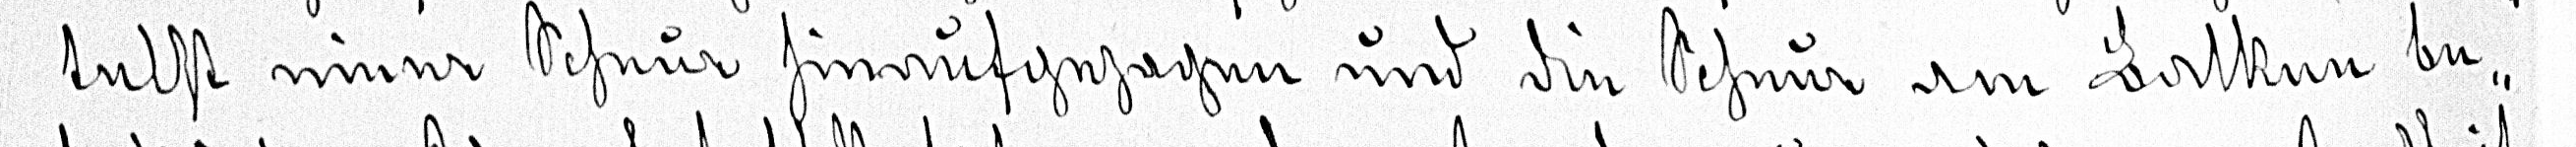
telst einer Schnur hinaufgezogen und die Schnur am Balken be¬
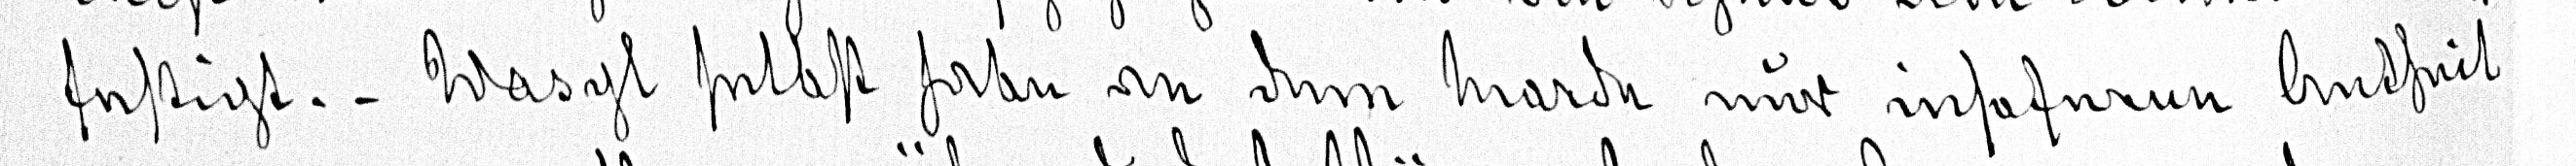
festigt.- Wasyl selbst habe an dem Morde nur insoferne Antheil
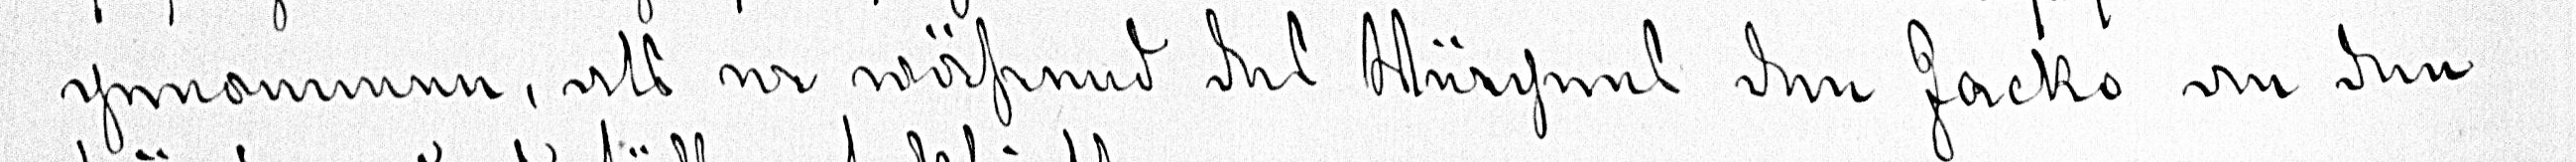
genommen, als er während des Würgens den Jacko an den
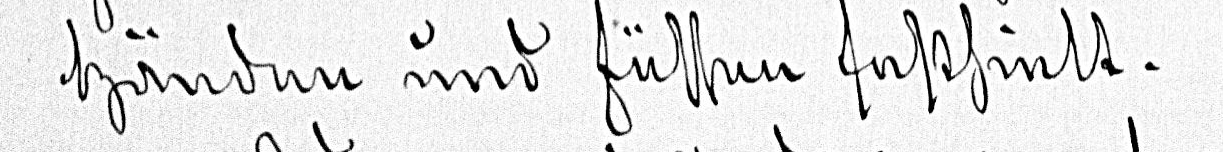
Händen und Füssen festhielt.
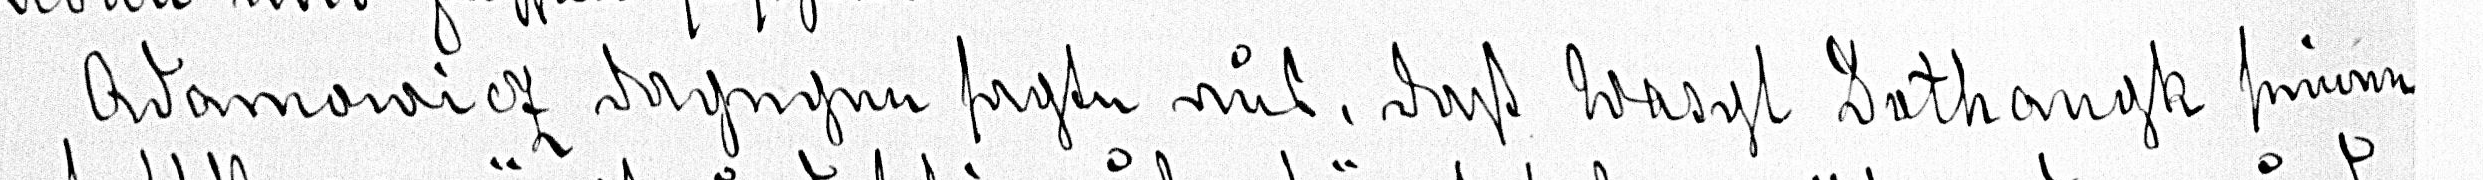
Adamowicz dagegen sagte aus, daß Wasyl Dothanyk seinen
